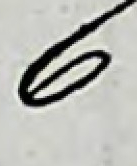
6
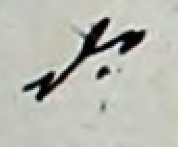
do
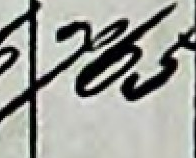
765
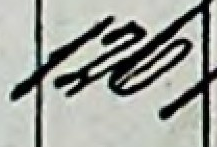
126
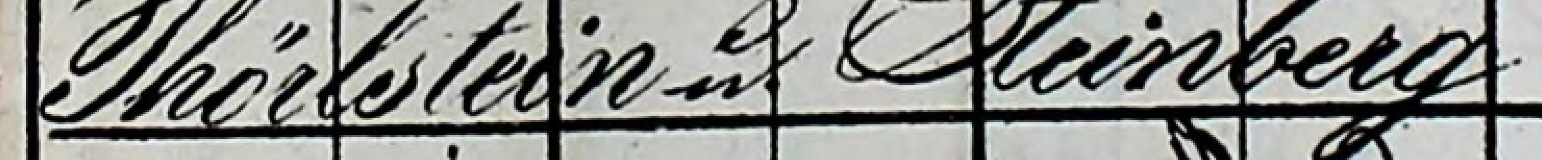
Thörlsteinn u. Steinberg
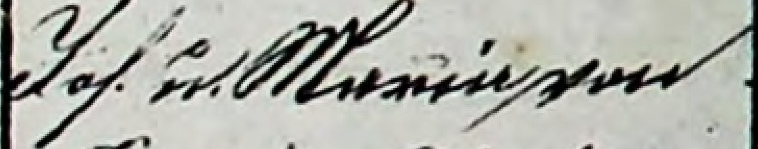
Jos. u. Maria von
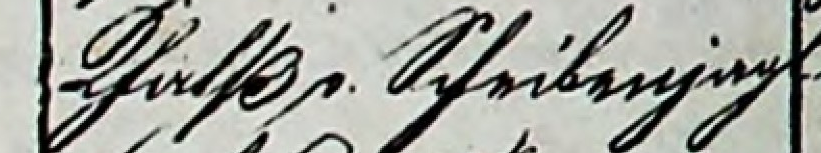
Khalß v. Scheibenjag
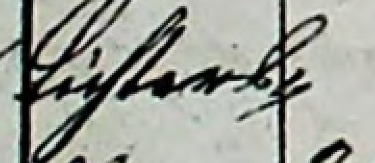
Lichters„
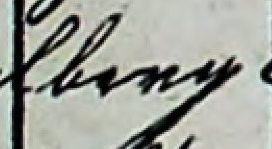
berg
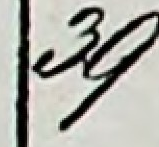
39
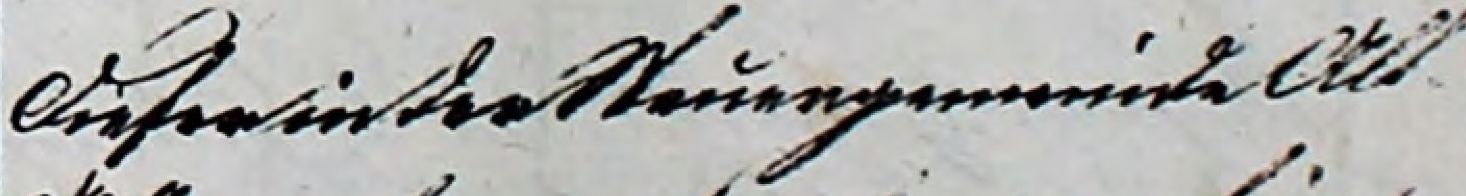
Dieser in der Steuergemeinde Alt-
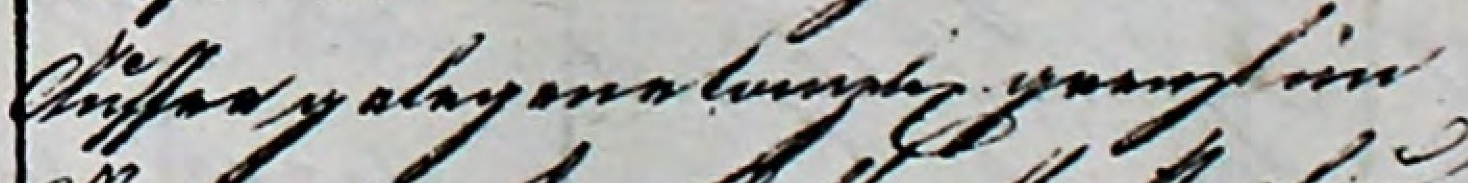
Aussee gelegene Complex grenzt im
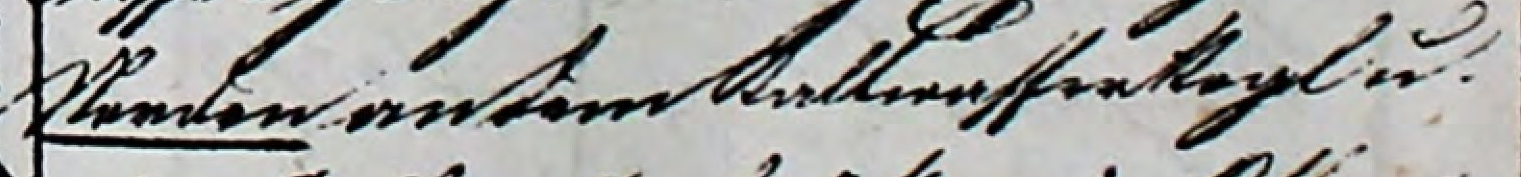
Norden an dem Kaltwasserkogl u.
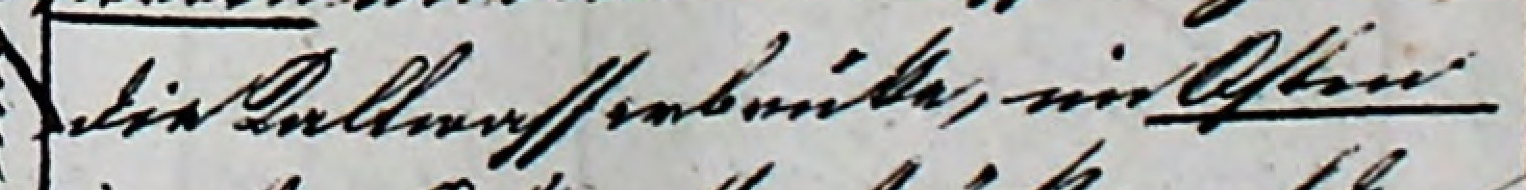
die Kaltwasserbrücke, im Osten
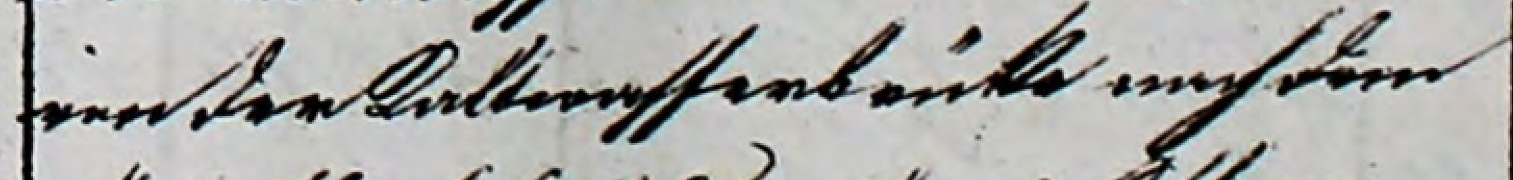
von der Kaltwasserbrücke nach dem
